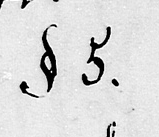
§. 5.
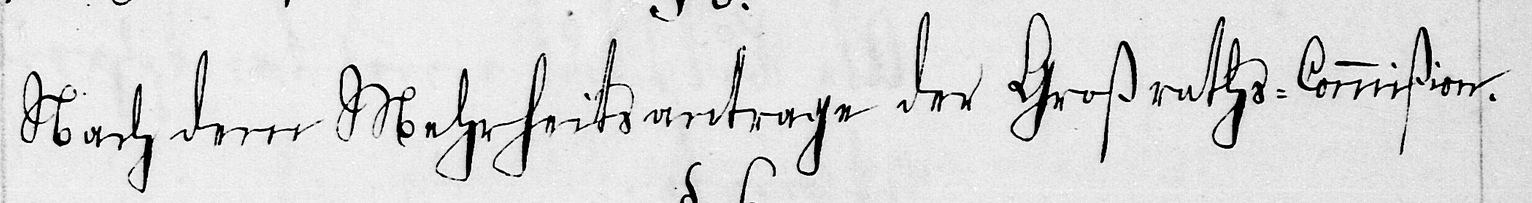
Nach dem Mehrheitsantrage der Großraths-Commißion.
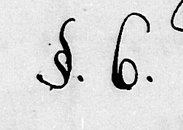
§. 6.
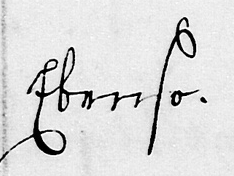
Ebenso.
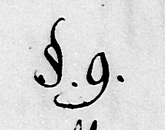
§. 9.
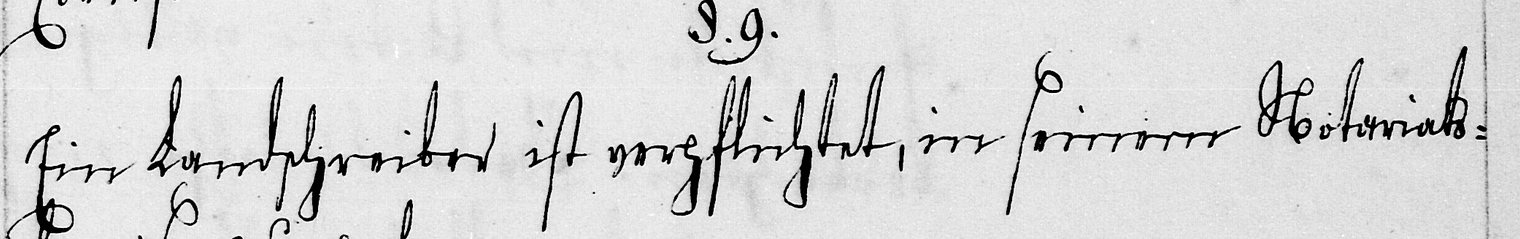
Ein Landschreiber ist verpflichtet, in seinem Notariats¬
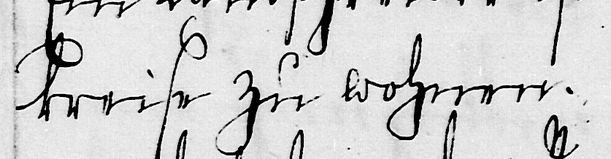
kreise zu wohnen.
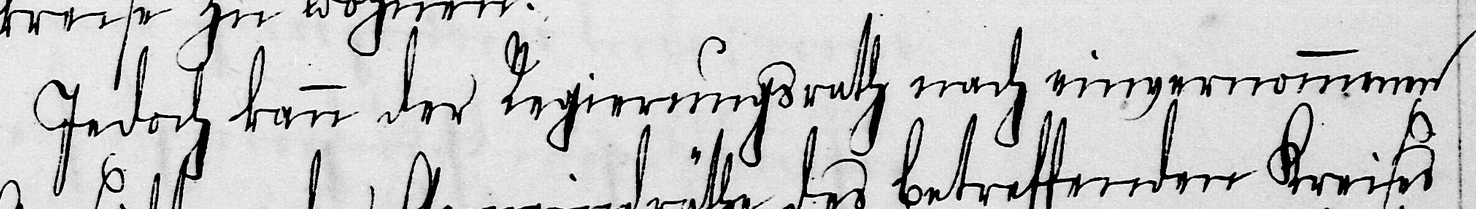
Jedoch kann der Regierungsrath nach einvernommenen
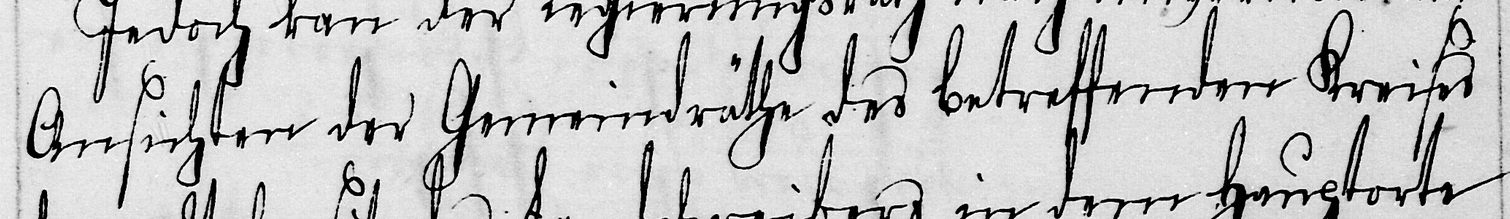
Ansichten der Gemeindräthe des betreffenden Kreises
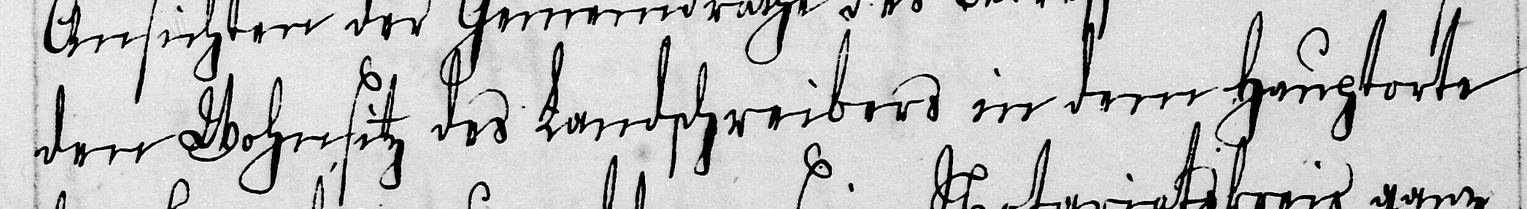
den Wohnsitz des Landschreibers in dem Hauptorte
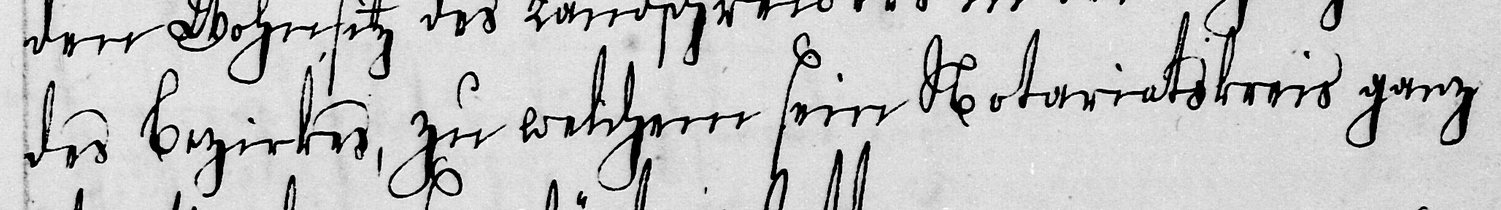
des Bezirkes, zu welchem sein Notariatskreis ganz
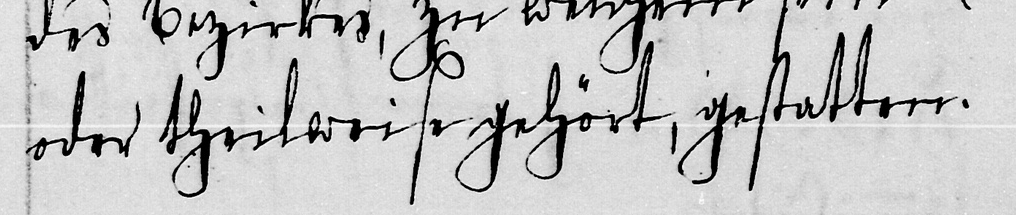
oder theilweise gehört, gestatten.
